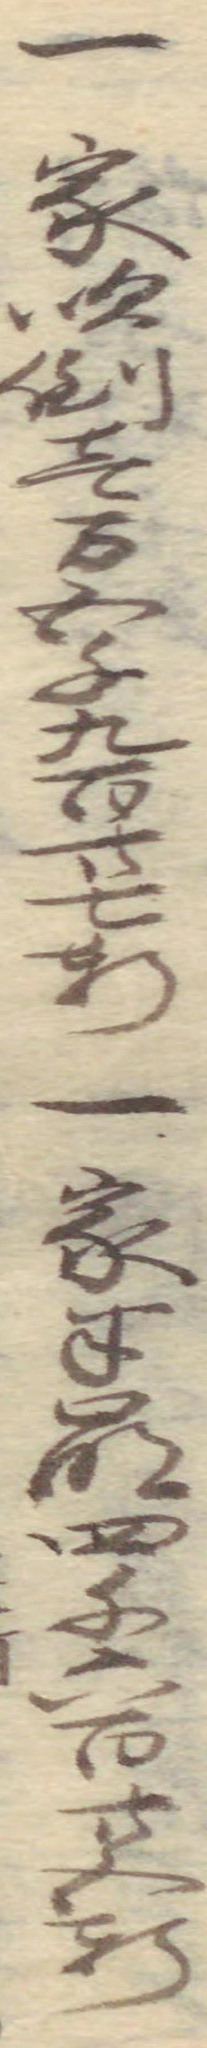一家吹倒壱万五千九百廿七軒一家半崩四千六百廿五軒
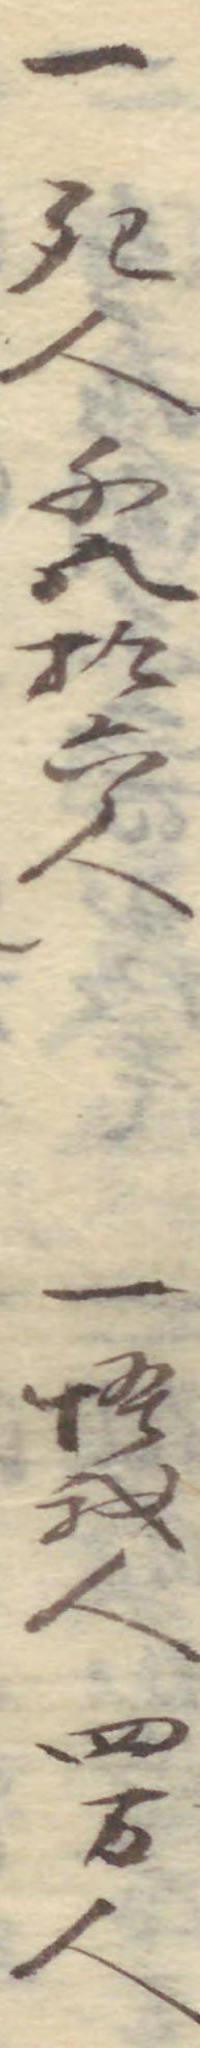一死人千九拾六人一怪我人四万人
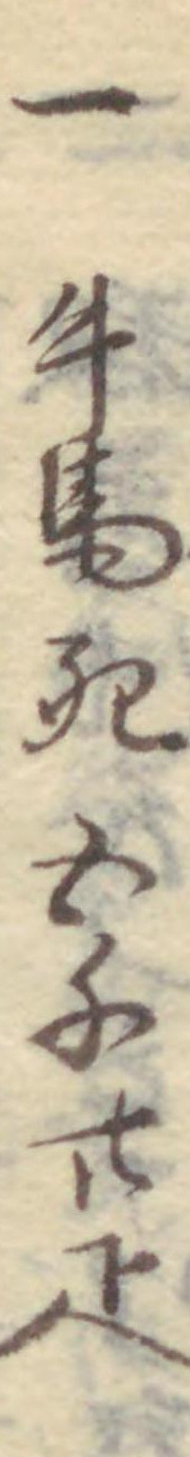一牛馬死五千廿疋
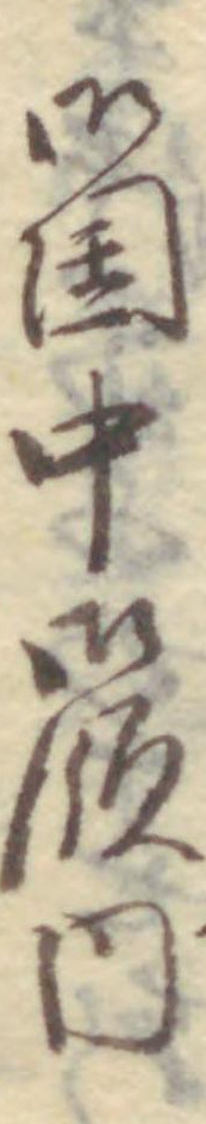御国中御領内
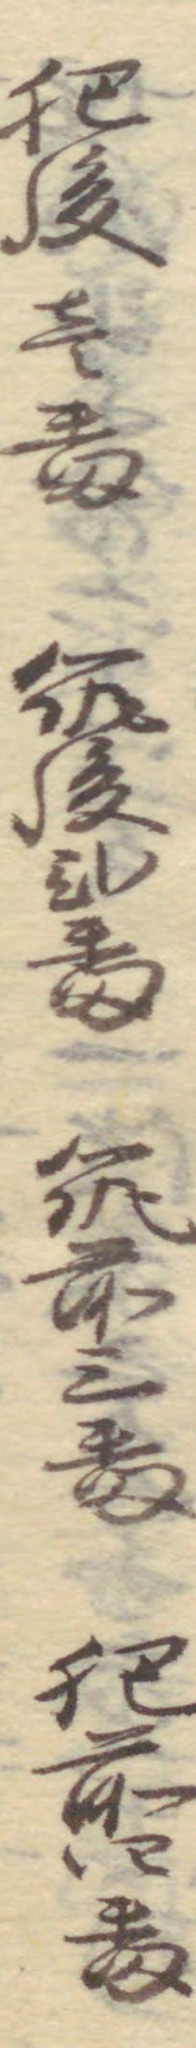肥後壱番筑後弐番筑前三番肥前四番
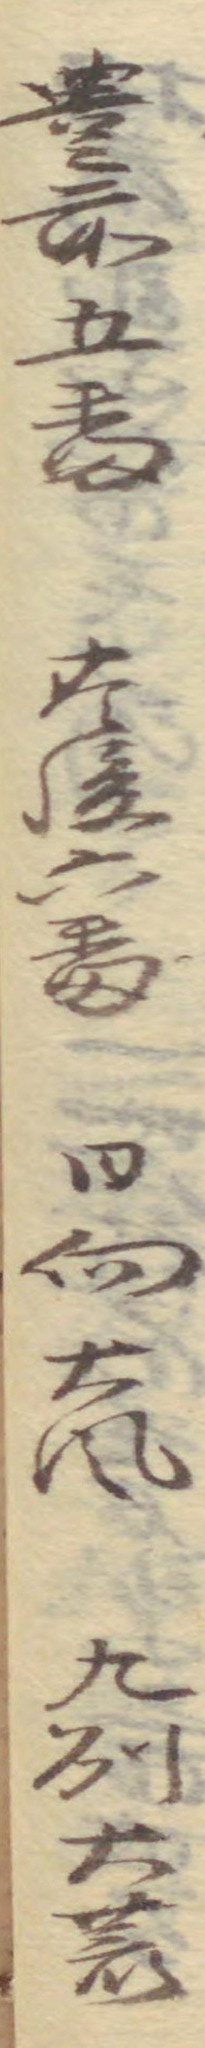豊前五番豊後六番日向大風九州大荒
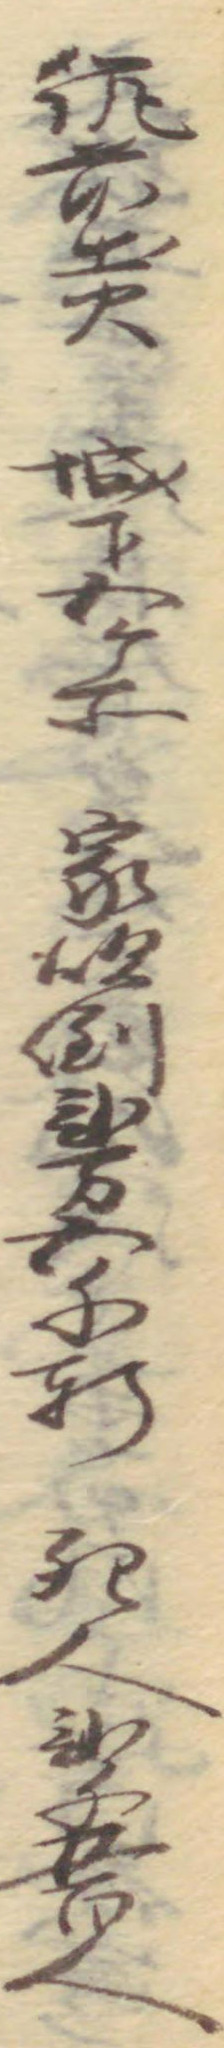筑前出火城下五ケ所家吹倒弐万五千軒死人弐千五百人
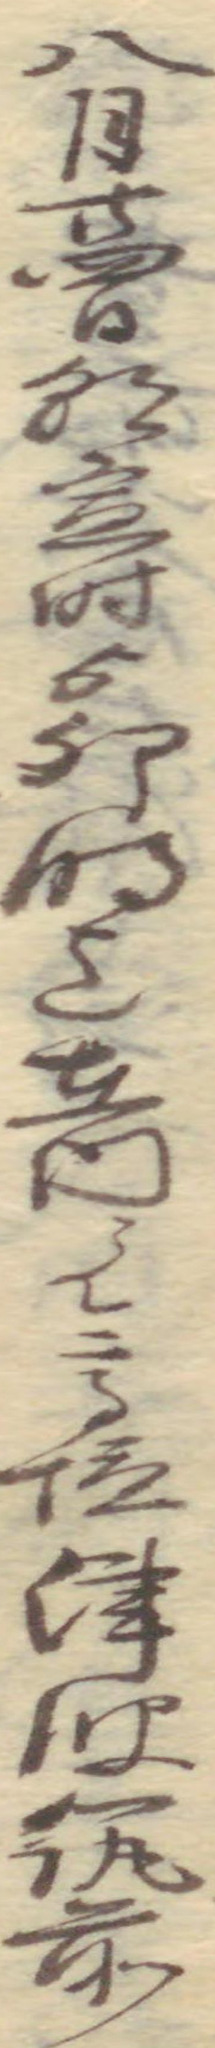八月廿四日朝寅時ゟ卯時迄在内ニて高塩津波筑前
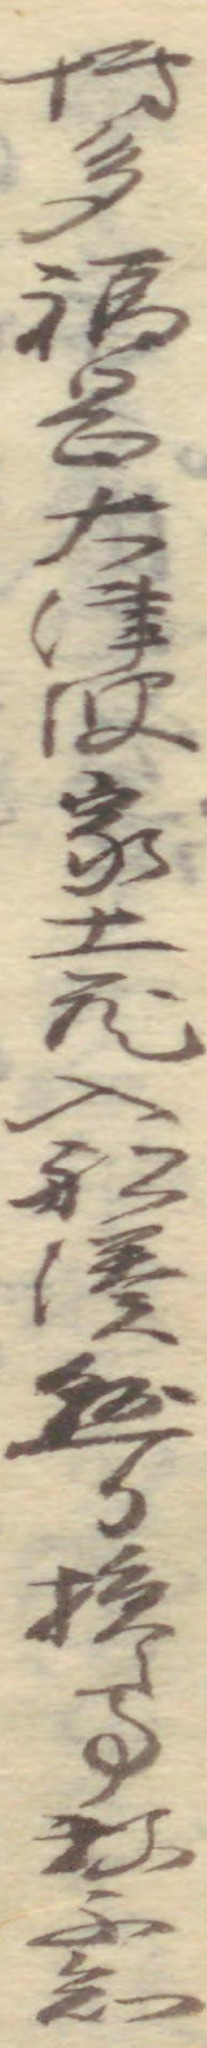博多福岡大津波家土蔵入船湊懸り損候事数不知
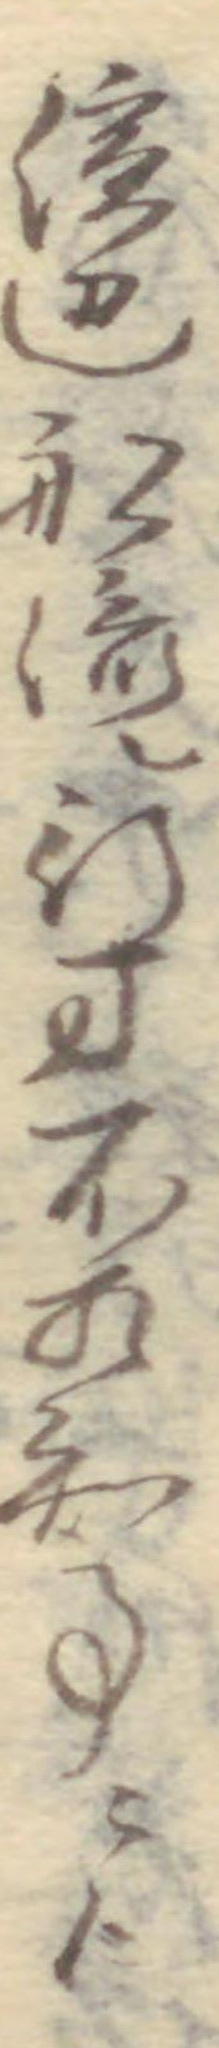濱辺船流レ行方不相知事ニ候
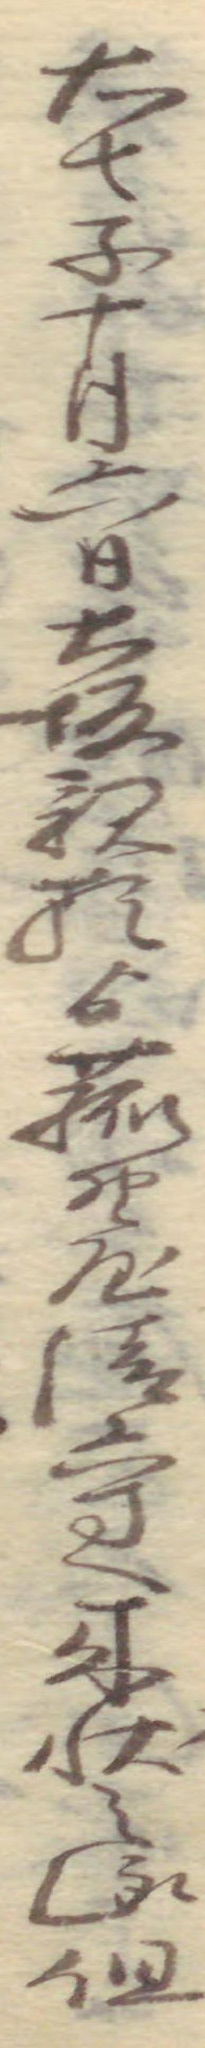右は子十月六日大坂親類ゟ菰野屋清六方へ来状之趣但
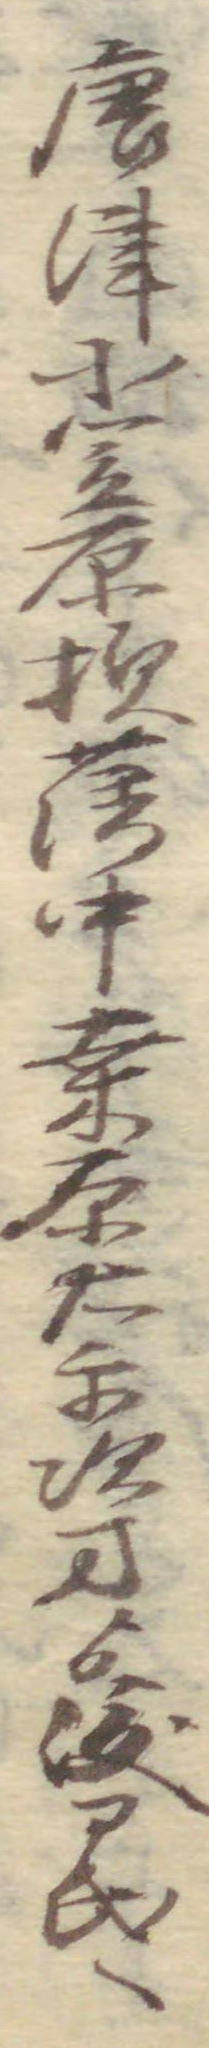唐津小笠原様藩中桑原左平次方ゟ渡部氏へ
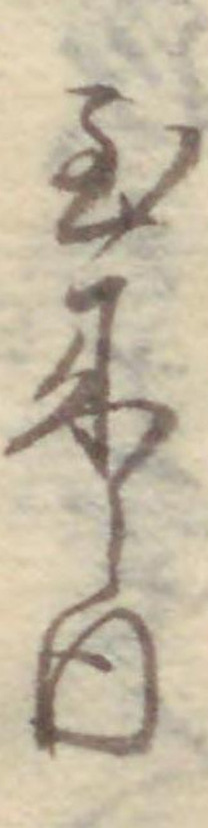到来之内
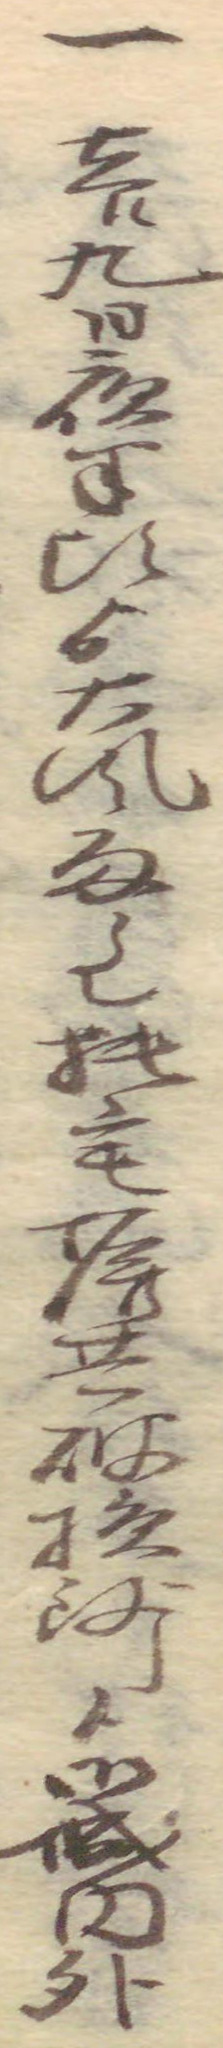一去ル九日夜半頃ゟ大風雨ニて拙宅塀共破損致し候御城内外
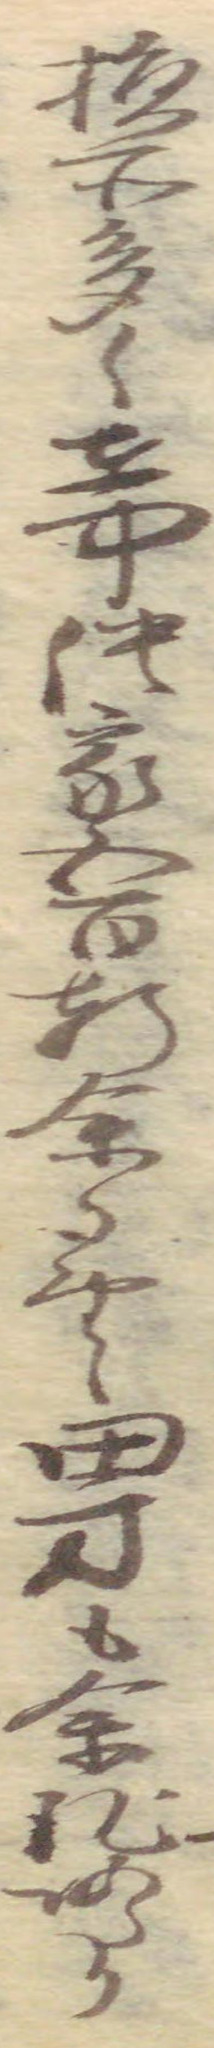損所多く在中潰家五百軒余に御座候田方も余程あたり
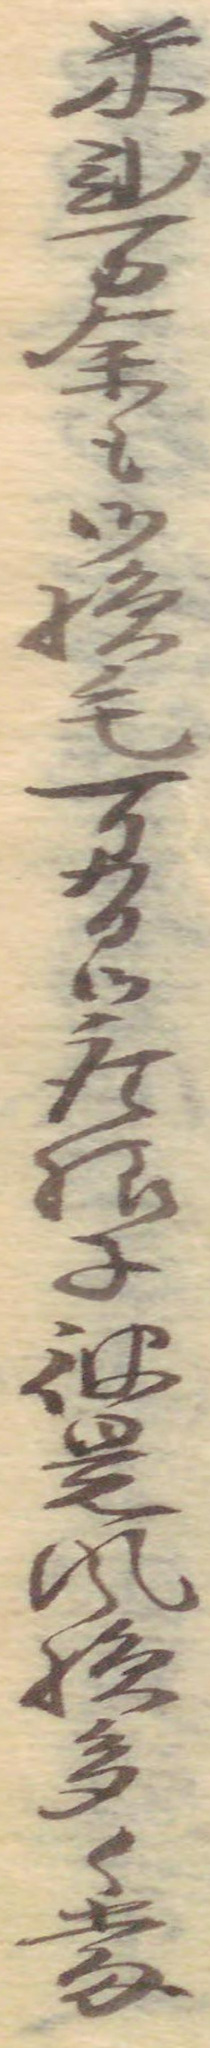米弐万余も御損毛可有御座候様子彼是風損多く当
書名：鶯宿雑記. 巻199-200
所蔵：国立国会図書館 National Diet Library, JAPAN
